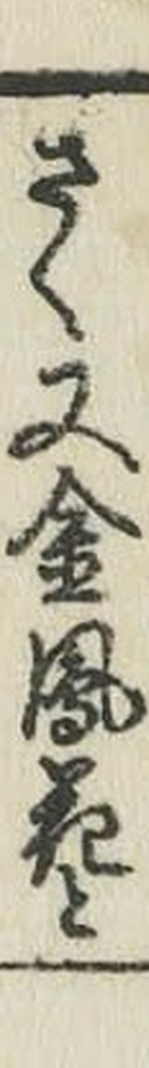さく又金鳳花と
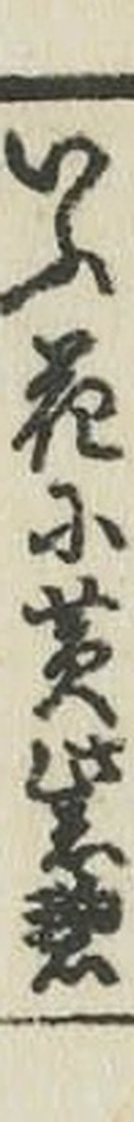いふ花に黄紫碧
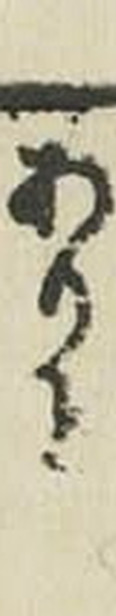ありと
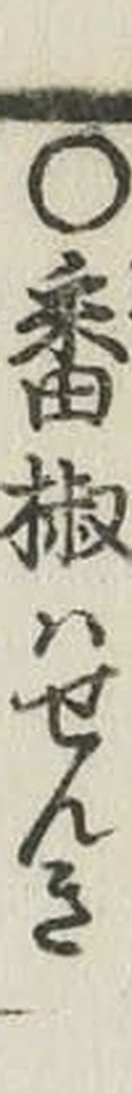○番椒はせんき
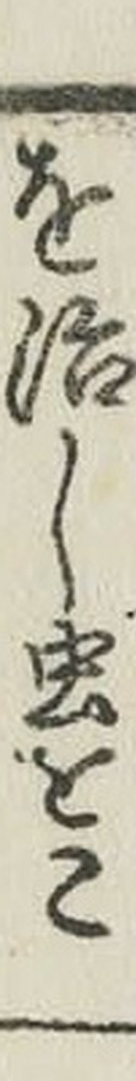を治し虫をこ
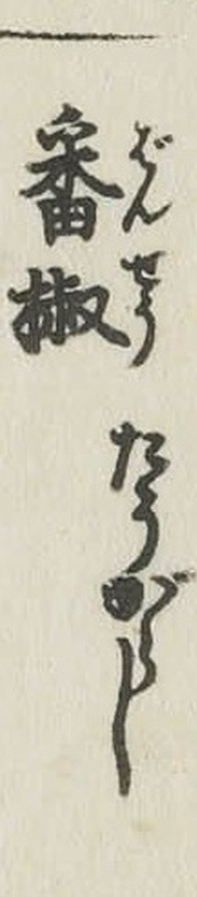番椒たうがらし
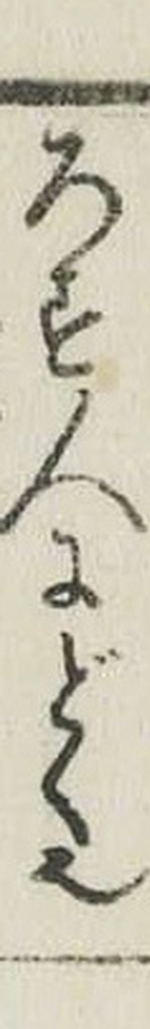ろす人にどく也
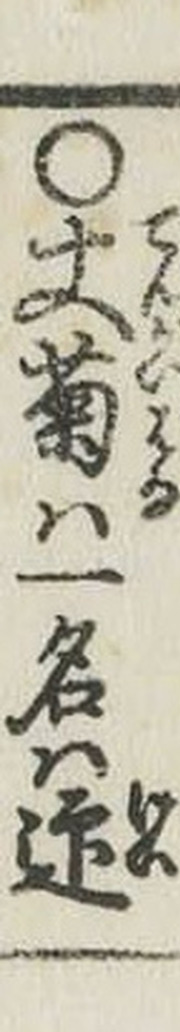○丈菊は一名は迎
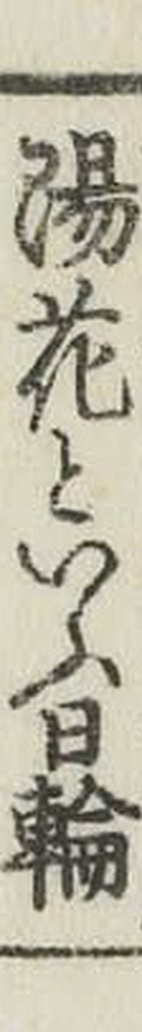陽花といふ日輪
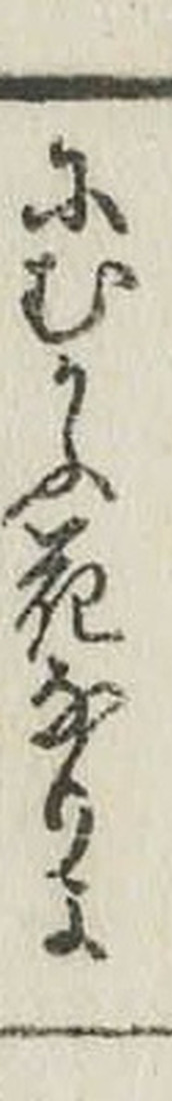にむかふ花なりよ
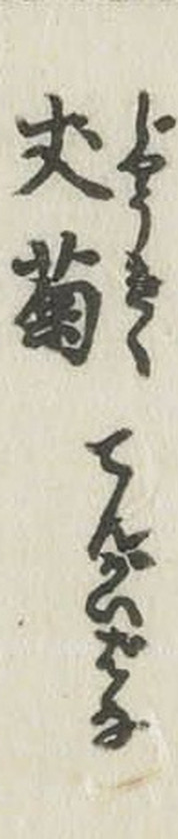丈菊てんがいばな
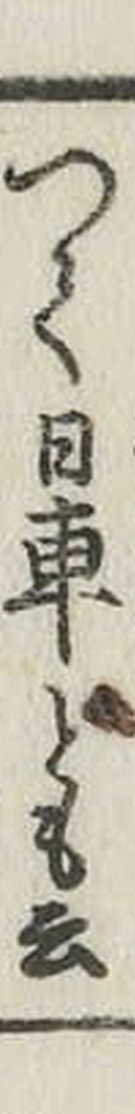つて日車とも云
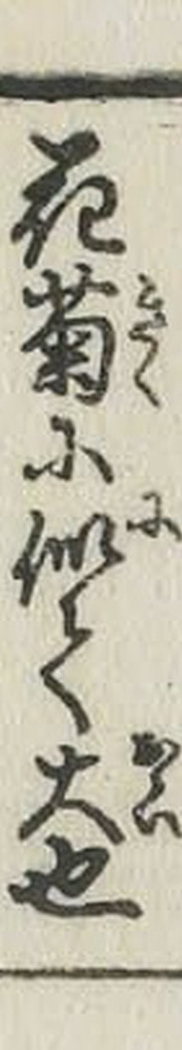花菊に似て大也
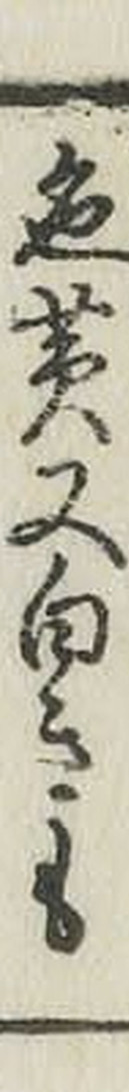色黄又白きも
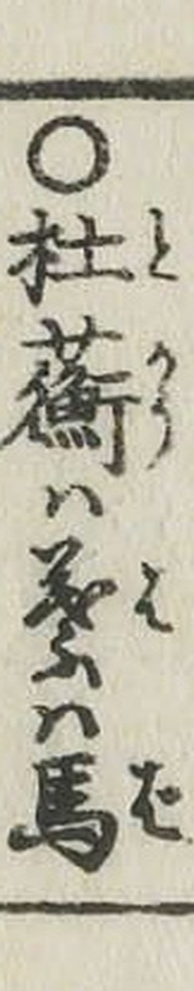○杜蘅は葉は馬
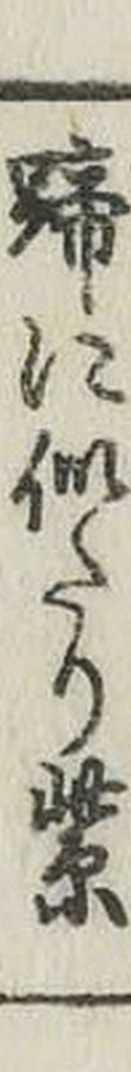蹄に似たり紫
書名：増補頭書訓蒙図彙大成 10巻 9:巻之20
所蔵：東京学芸大学教育コンテンツアーカイブ
